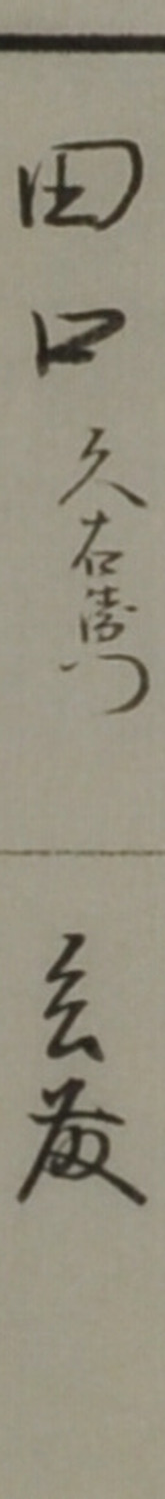田口久右衛門兵藤

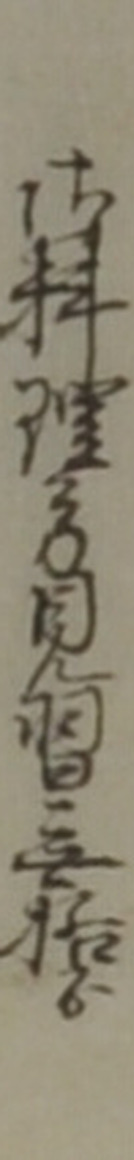御料理方見習無格ゟ
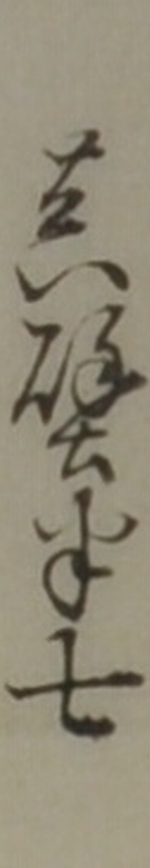真壁半七
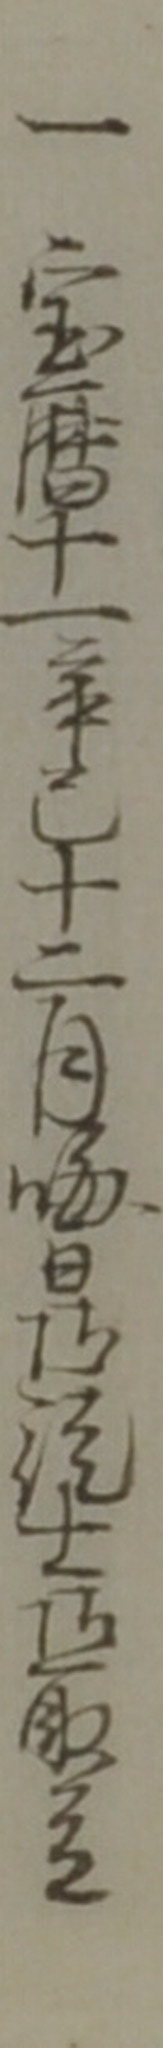一宝暦十一辛巳十二月晦日御徒士御取立
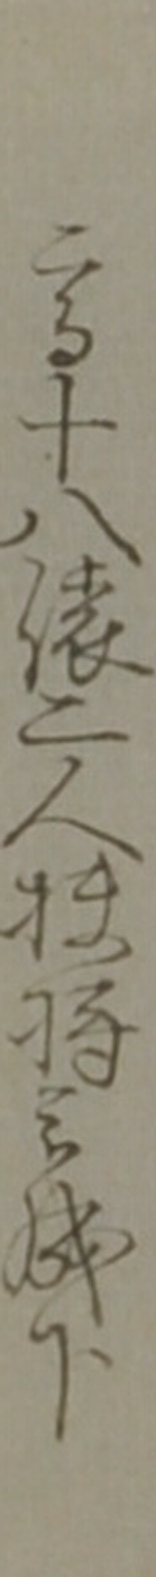高十八俵二人扶持被成下
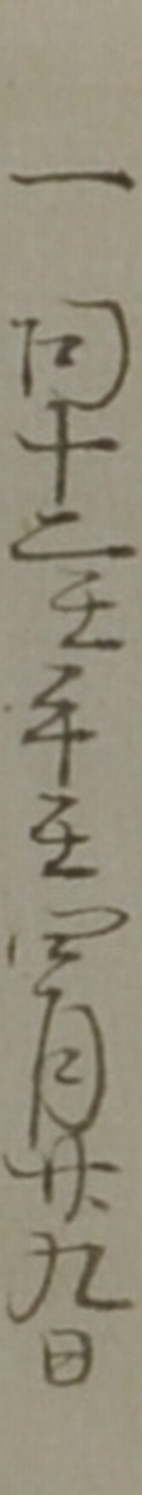一同十二壬午閏四月廿九日
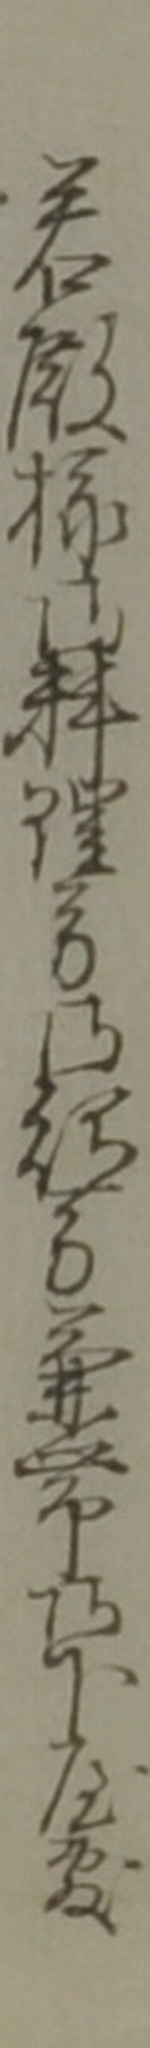若殿様御料理方御賄方兼帯御下屋敷
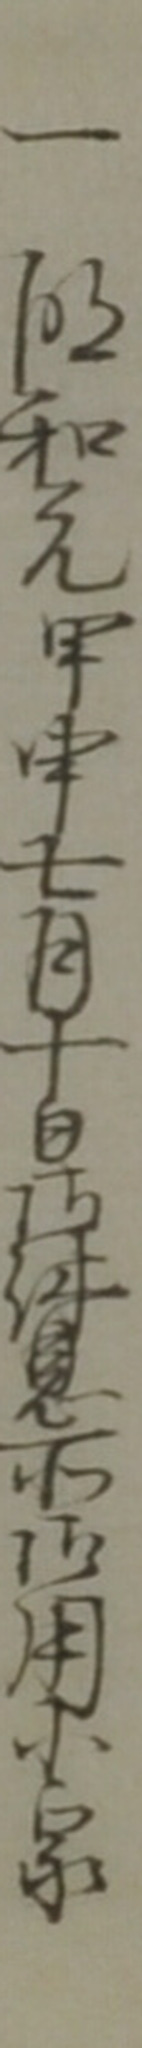一明和元甲申七月十日御休息所御用小家
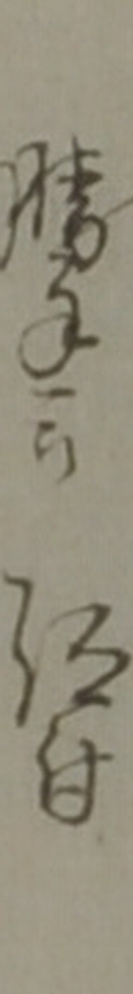勝手被仰付
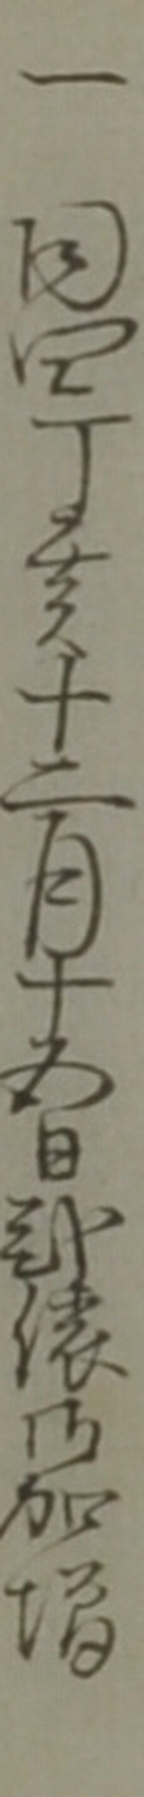一同四丁亥十二月十五日弐俵御加増
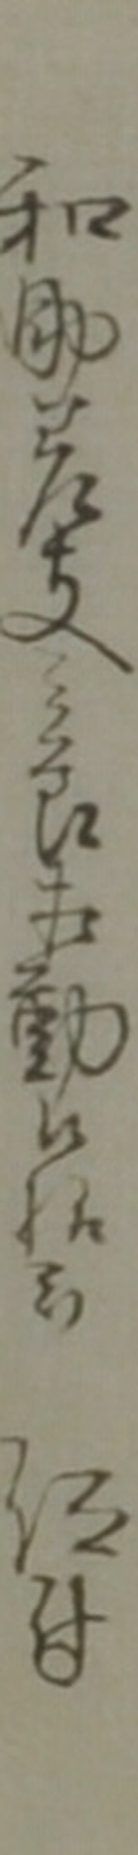和助差支之節相勤候様被仰付
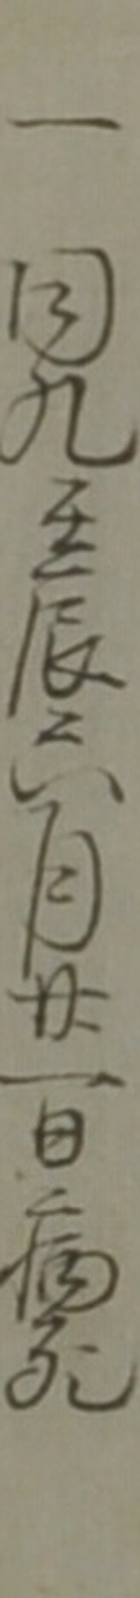一同九壬辰六月廿一日病死
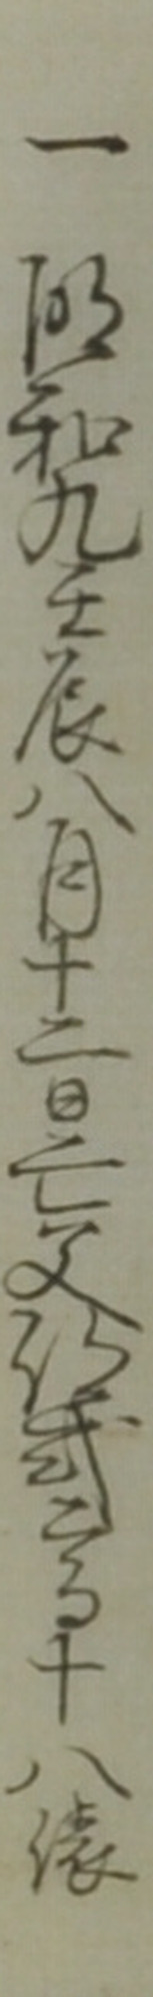一明和九壬辰八月十二日亡父跡式高十八俵
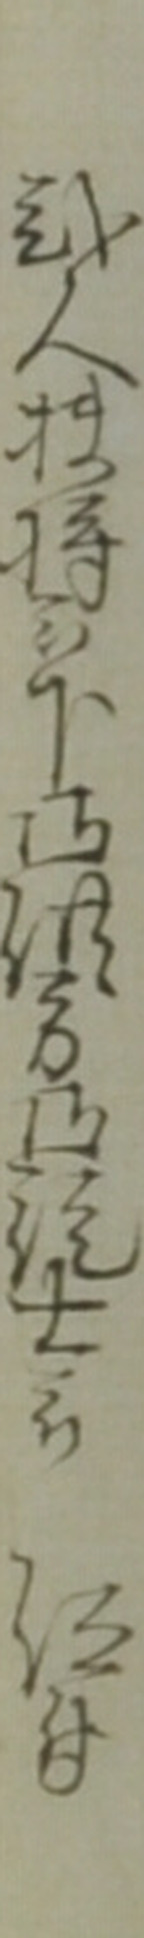弐人扶持被下御供方御徒士被仰付

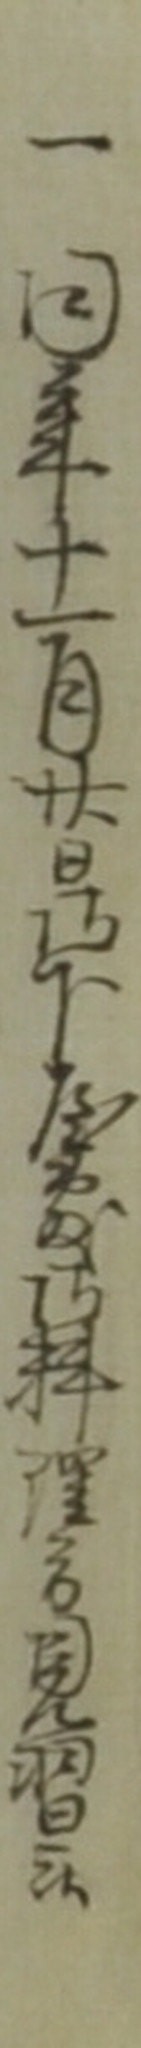一同年十一月廿日御下屋敷御料理方見習被
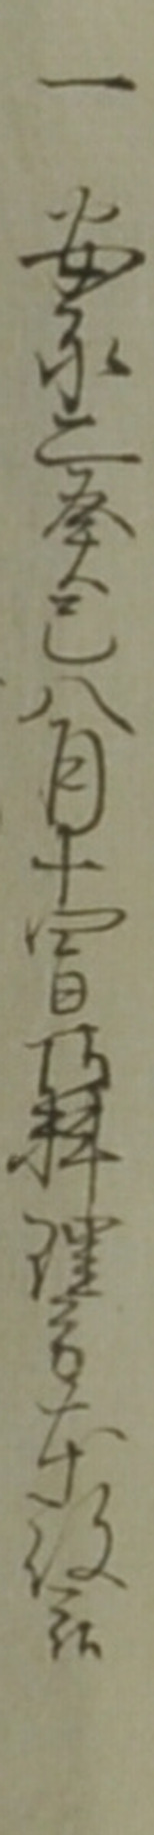一安永二癸巳八月十四日御料理方本役被
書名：無足諸士勤仕録（九）
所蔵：伊那市立高遠町図書館・合同会社AMANE
